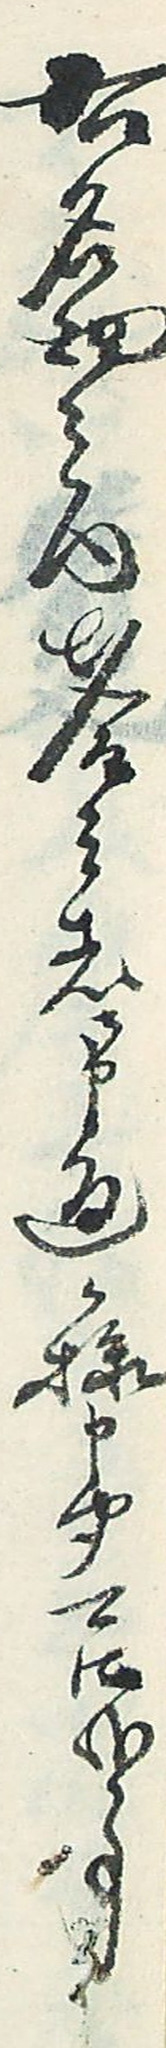右名西之内出合之者ニ申通候様申聞可仕哉事
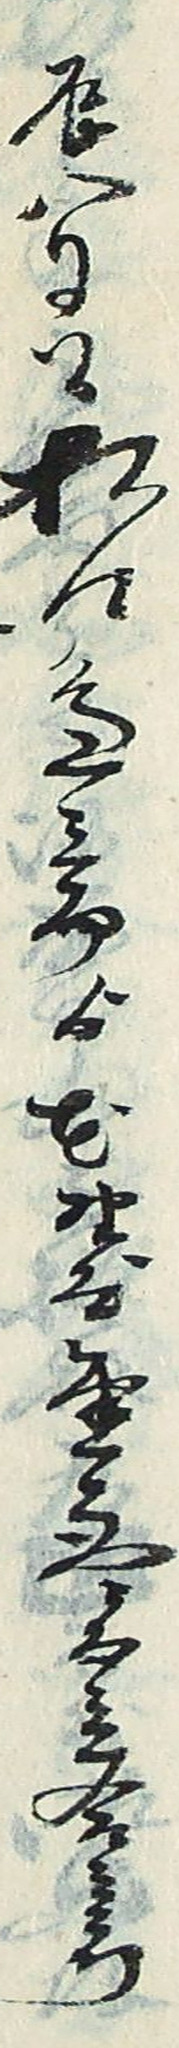辰八月八日松江島三郎ゟ花野屋金兵衛門ニ而立合之節
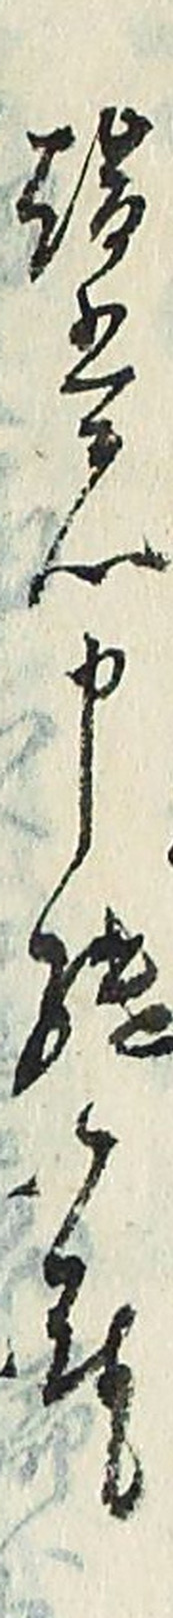端書ヲ以申継御座候
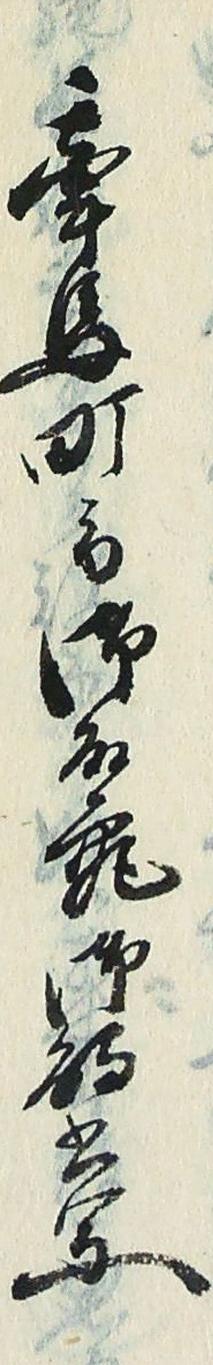牽馬町方御取究御触書写
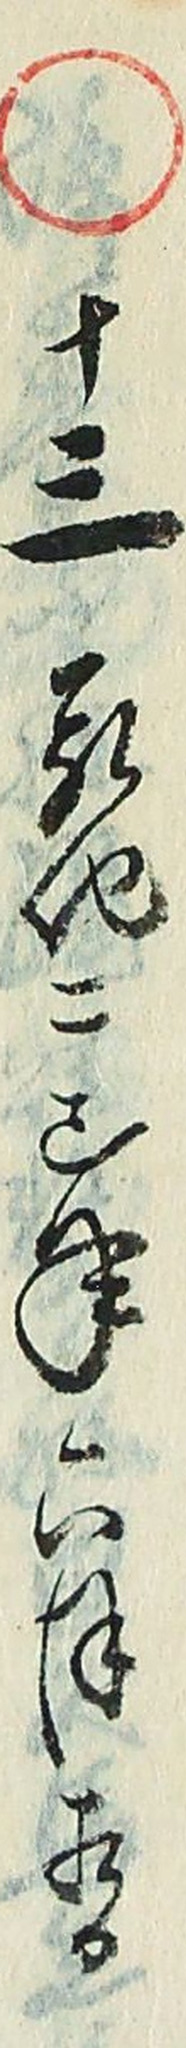○十三弘化二巳年六月十九日
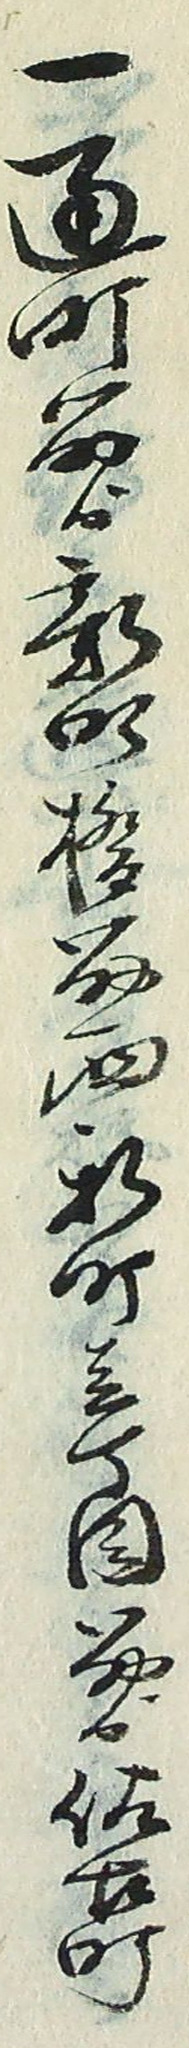一通町筋ゟ新町橋筋西新町壱丁目筋ゟ佐古町
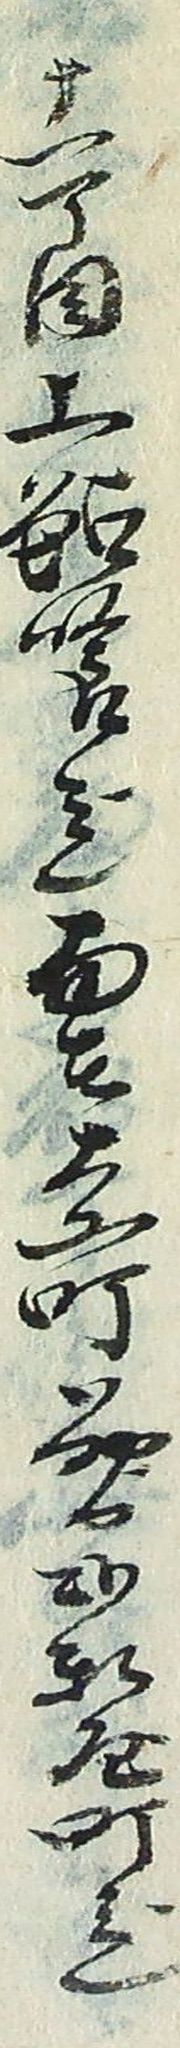十一丁目上鮎喰迄南者大工町筋ゟ弐軒屋町迄
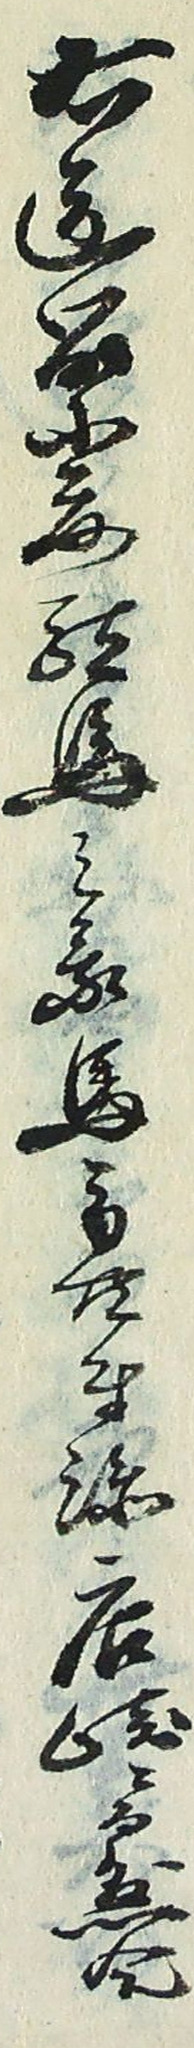右道筋小荷駄馬之義馬方共付添店崎ニ而懸合
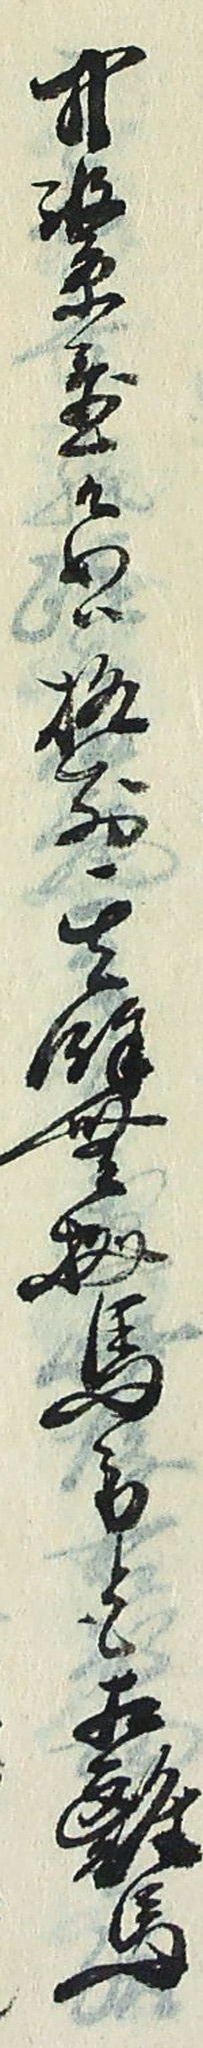中繋置候義ハ格別其餘無拠馬方とも相離馬
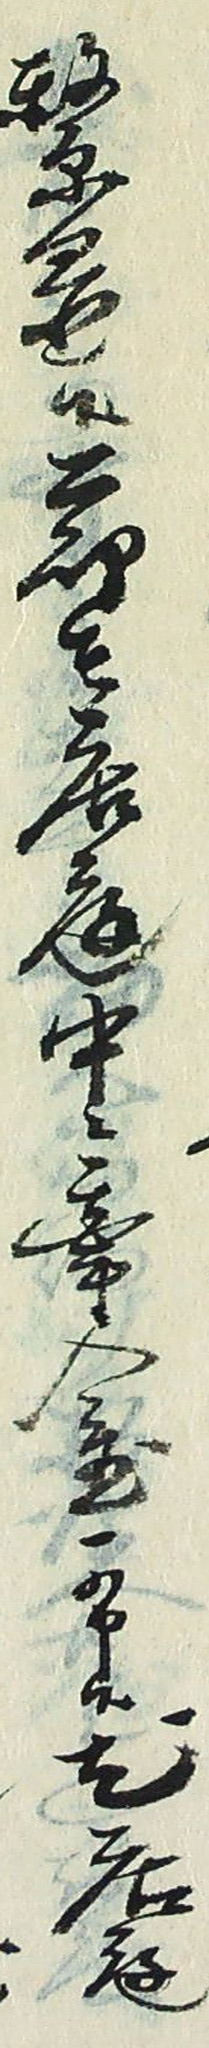繋置候節者店庭中ニ牽入置可申候尤店庭
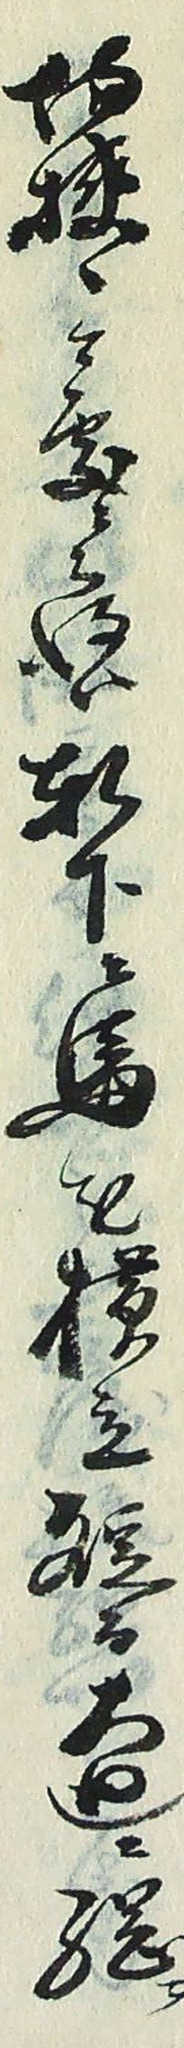場狭く候處ニ候得ハ軒下ニ馬を横立短而大廻ニ綱ヲ
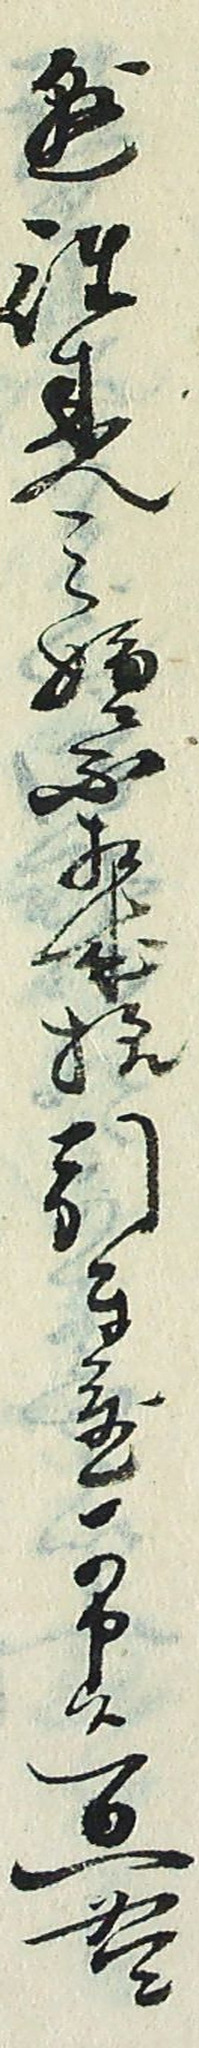懸往来人之妨ニ不相成様引付置可申候万一右ニ
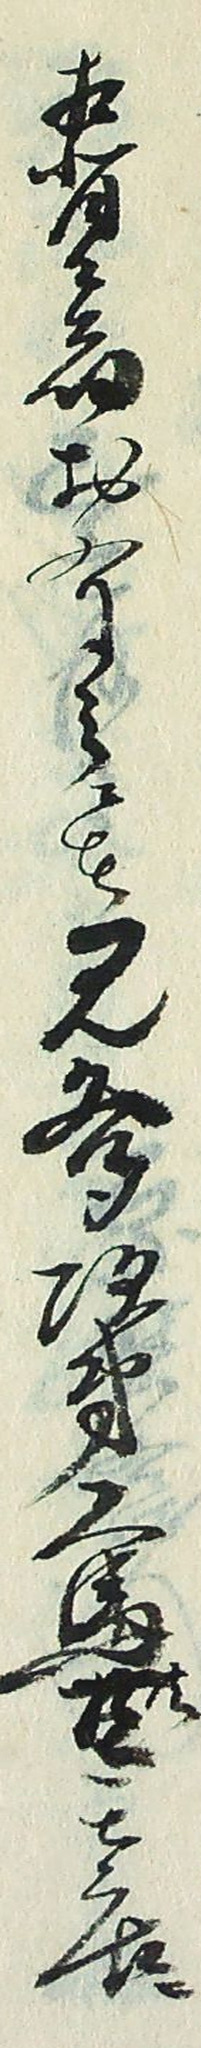相背候者於有之ニ者見咎メ次第人馬共其店ニ
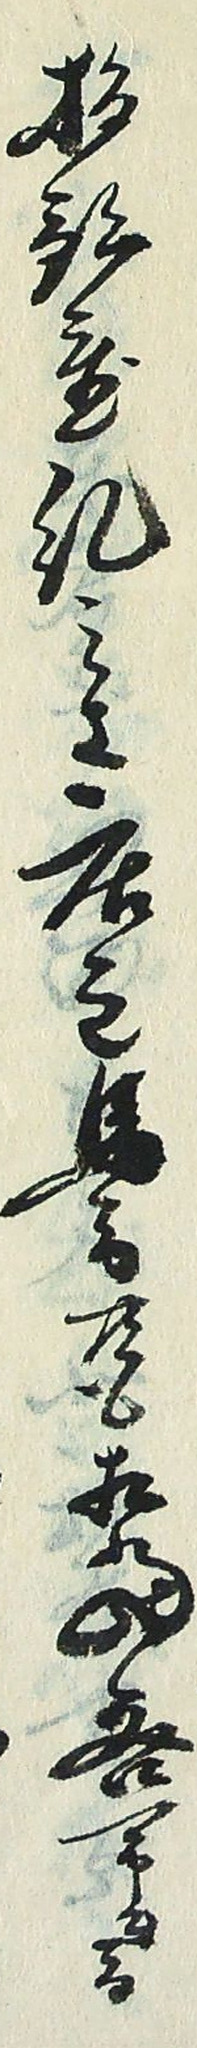指預置糺之上店主馬方共も相當咎可申付旨
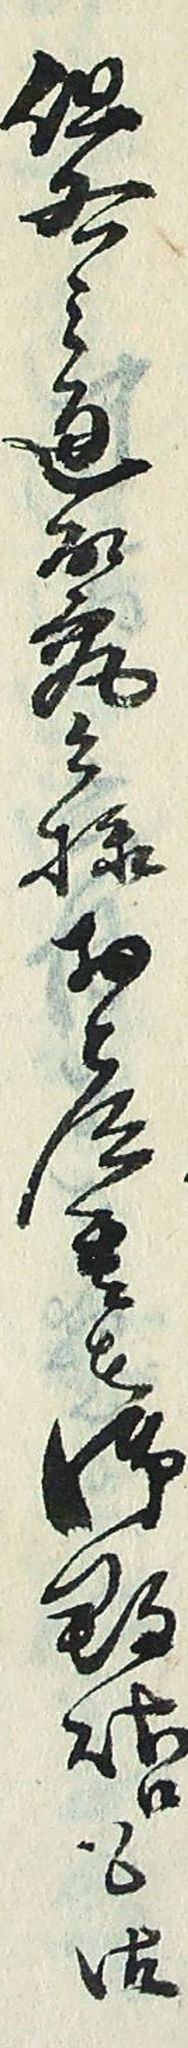但右之通取究候様於被仰付ニ者御郡代江も御
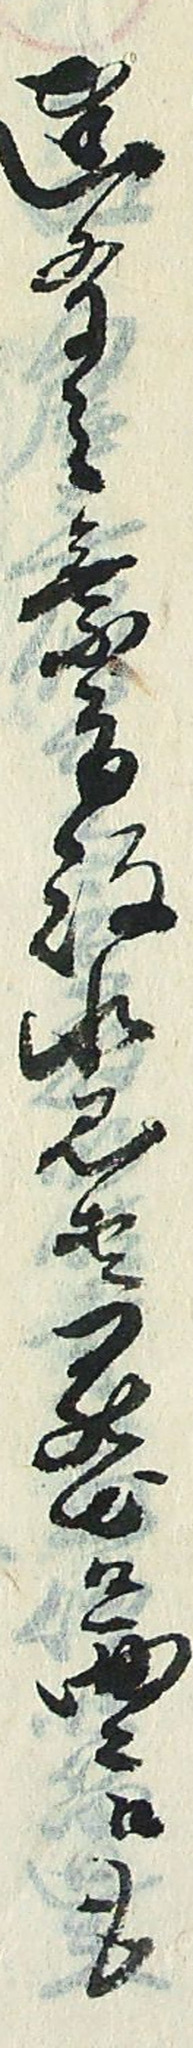達有之乗方役水見等ニ罷出候面々江も
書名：諸御趣意書并御下知向之写
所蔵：鳴門教育大学 Naruto University of Education
